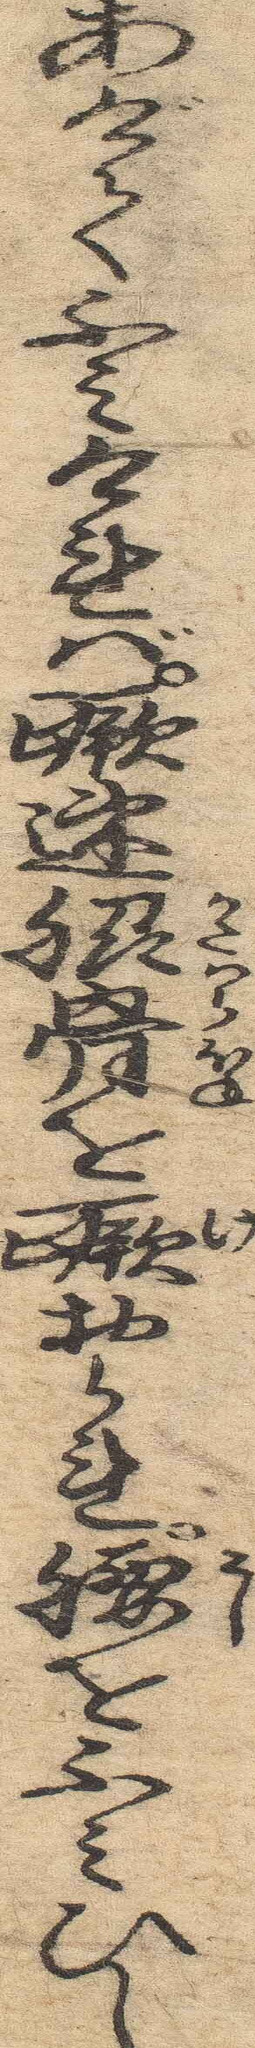あけてふみければ。蹶速脇骨を蹶おられ。腰をふみひし
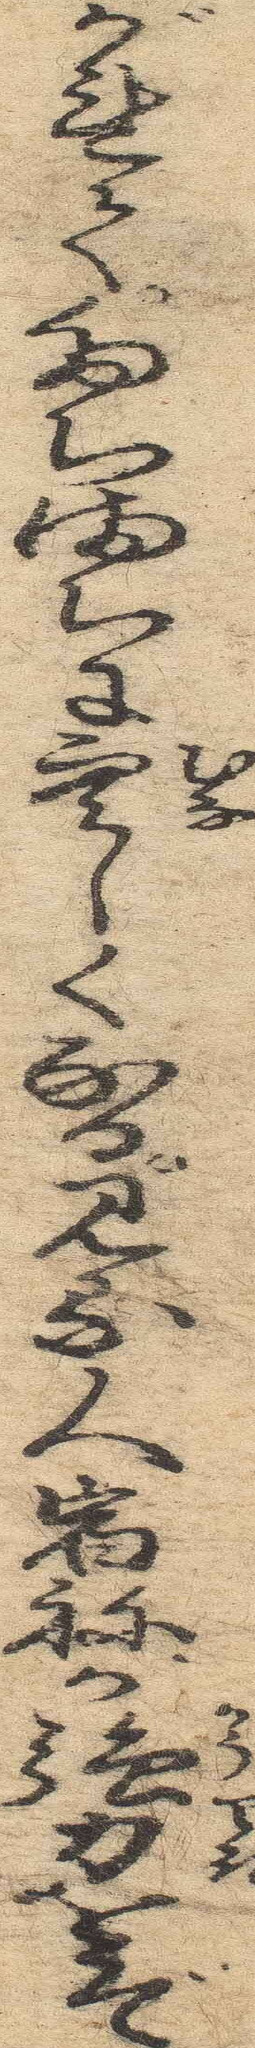がれて。たちまちに空しくなる。見分人宿祢が強力をぞ
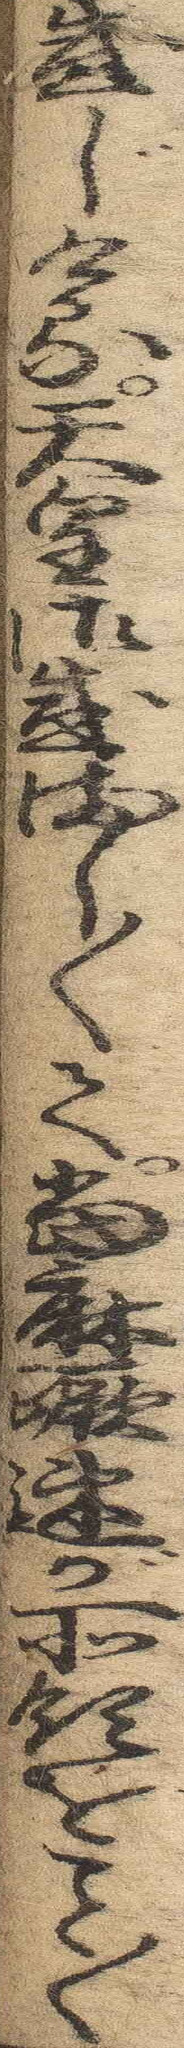感じける。天皇御感まし〳〵て当麻蹶速が所領をこと〳〵
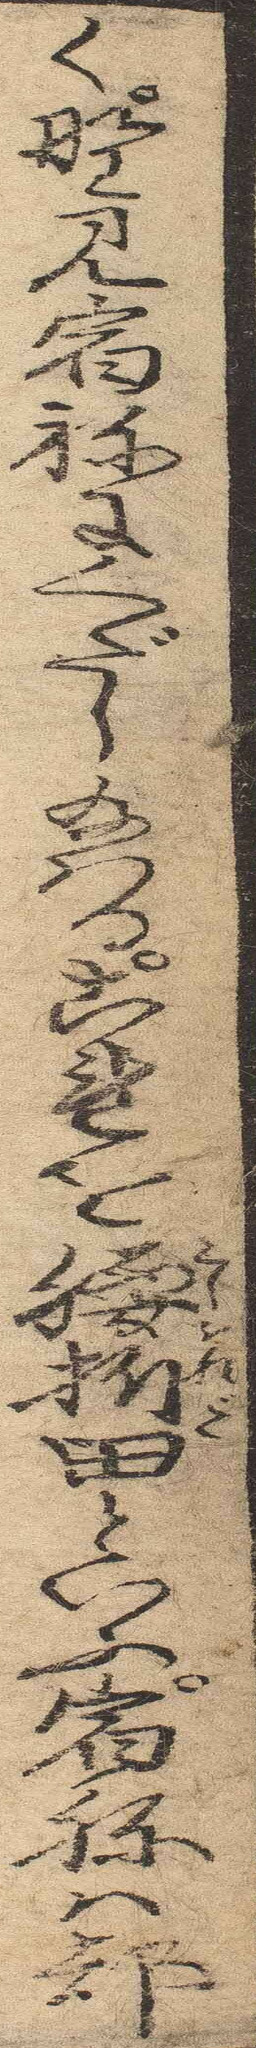く野見宿祢にくだし給はり。これを腰折田といふ。宿祢は都
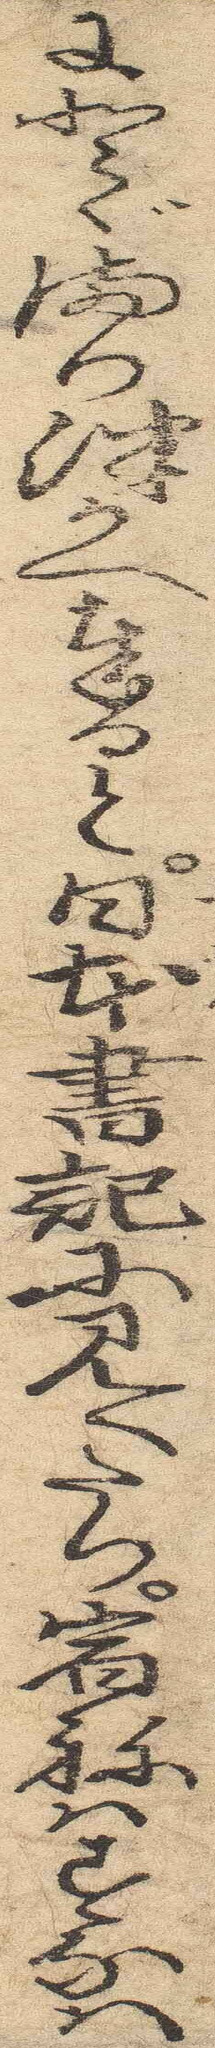にとゞまりつかへ奉ると。日本書記に見へたり。宿祢はすなは
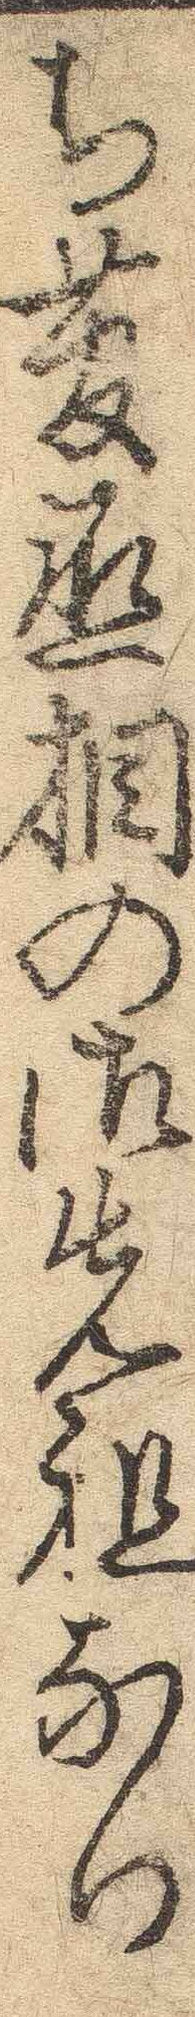ち管丞相の御先祖なり。
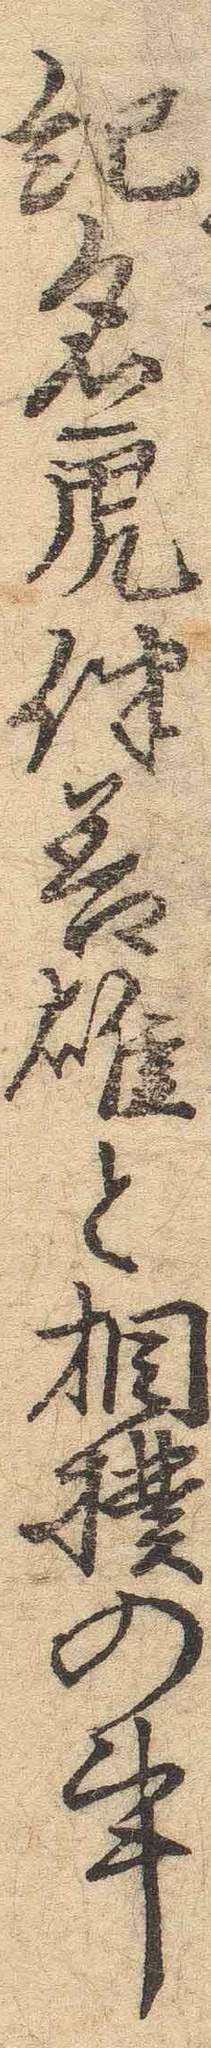紀名虎伴善雄と相撲の事
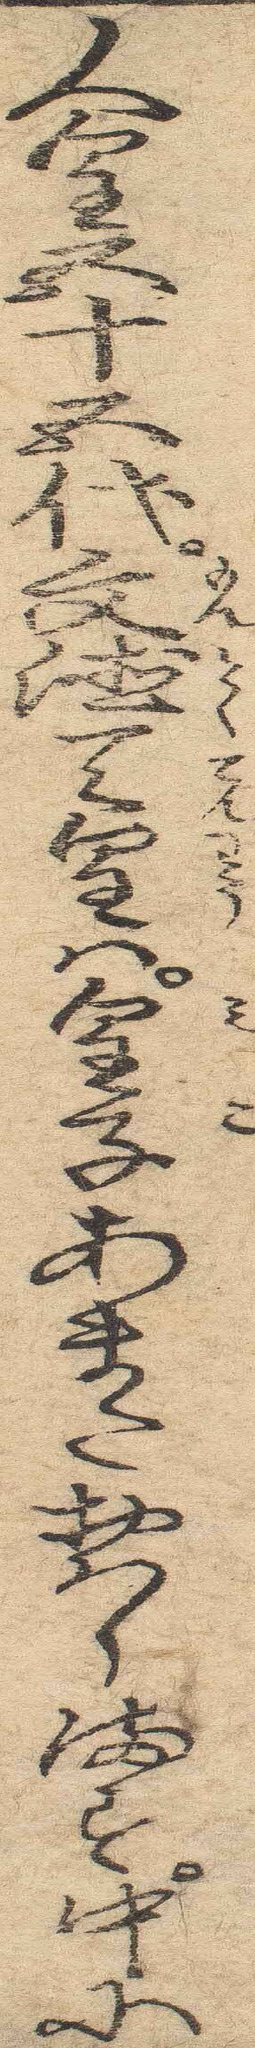人皇五十五代文徳天皇は。皇子あまたおはします。中に
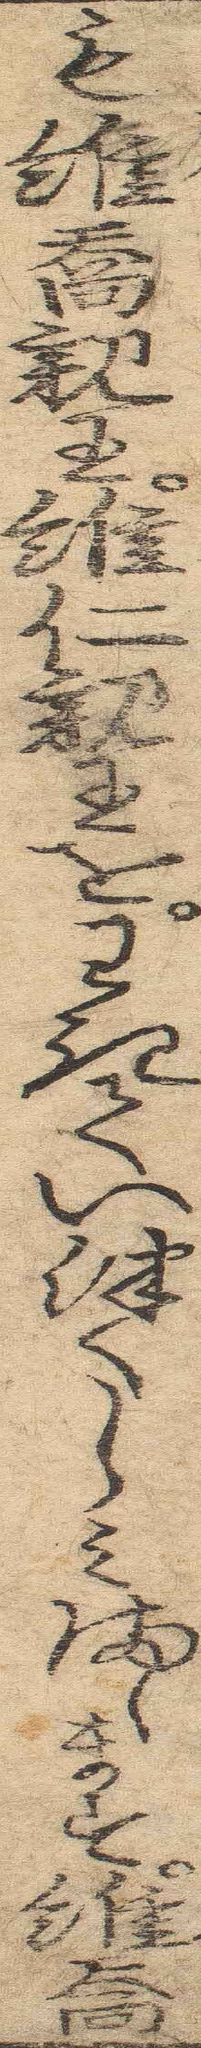も惟喬親王。惟仁親王を。わきていつくしみまします。惟喬
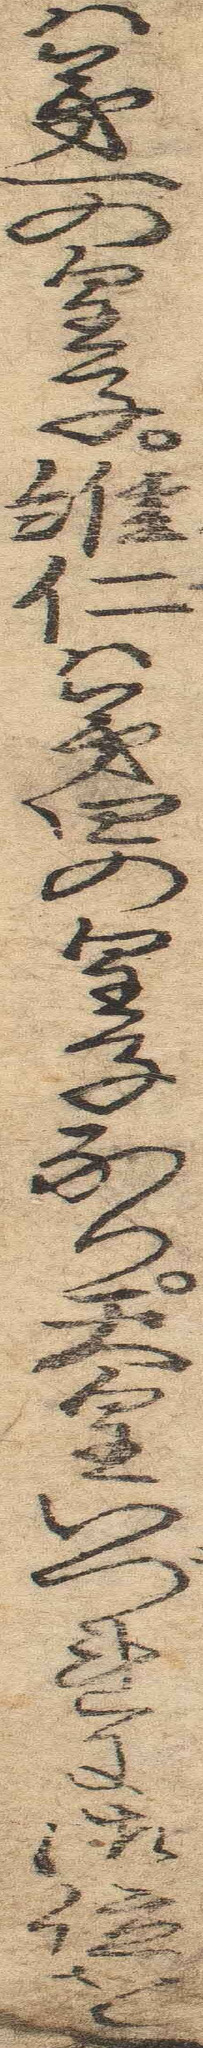は第一の皇子。惟仁は第四の皇子なり。天皇いづれに御位を
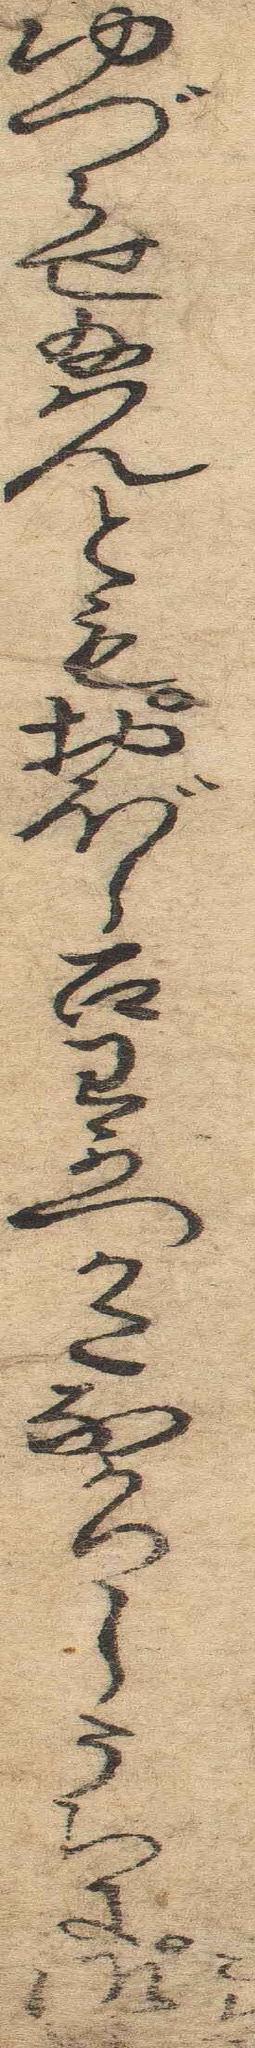ゆづらせ給はんとも。おぼし召わかつかたなかりしうちに。御嫡子
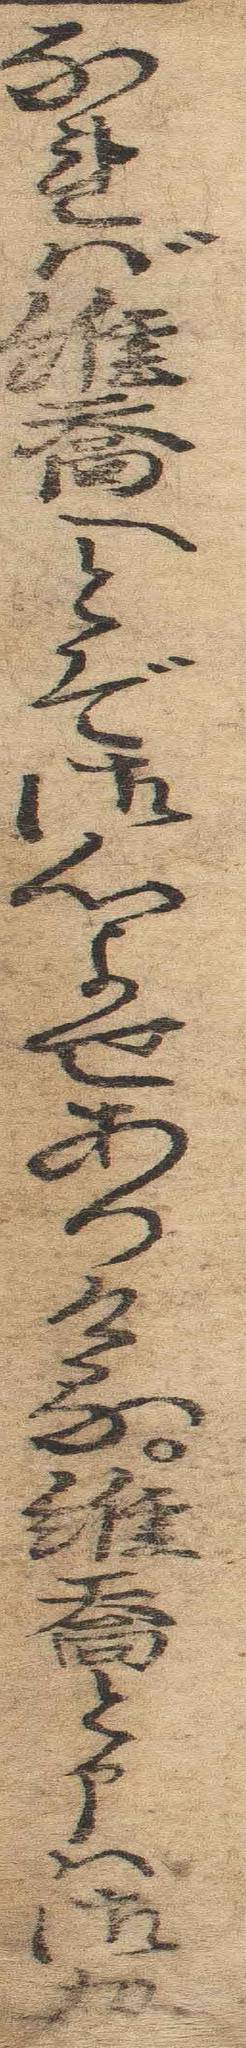なれば。惟喬へとぞ御心よせありける。惟喬と申は御母は従四

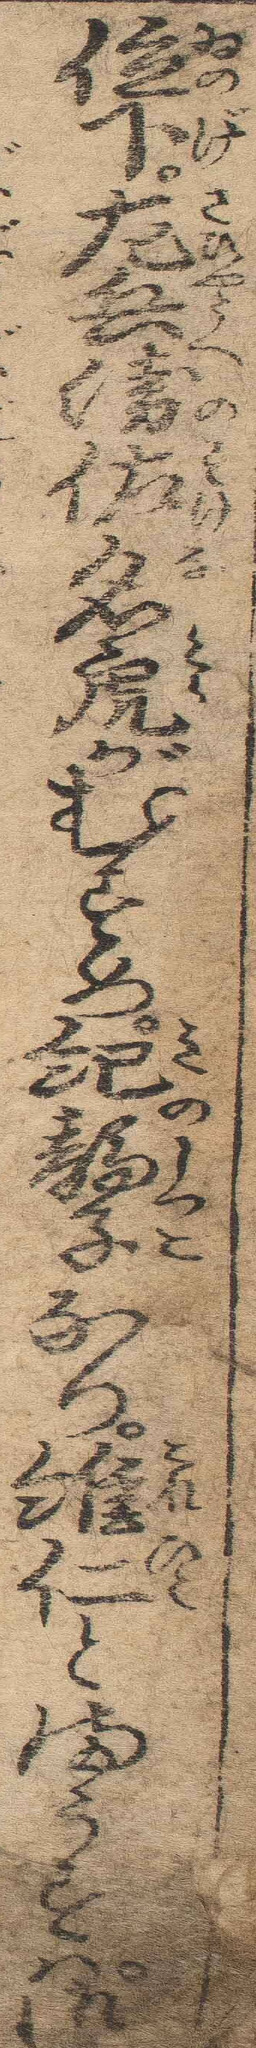位下。左兵衛佐名虎がむすめ。紀静子なり。惟仁とまうすは御
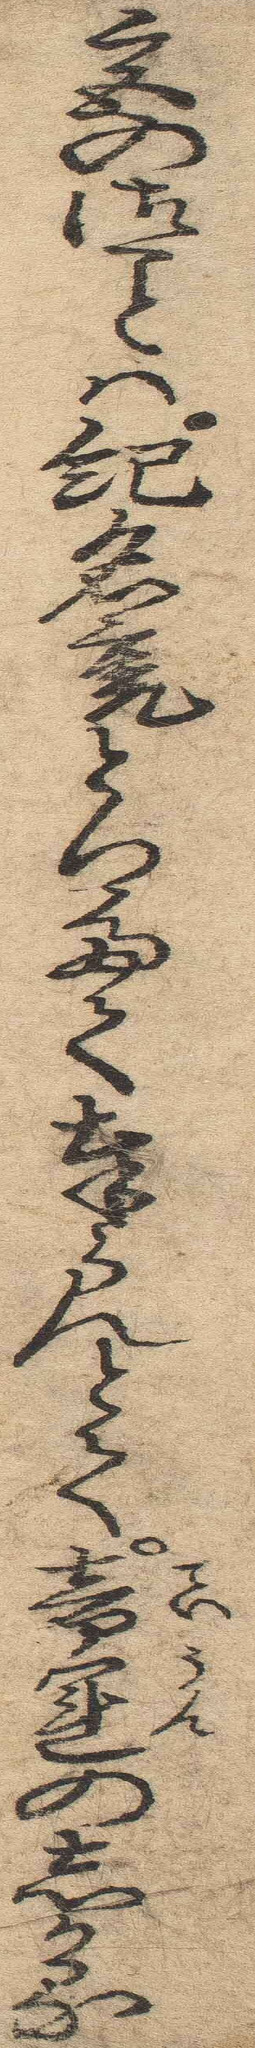宮の御ことは。紀名虎とりたて奉らんとて。帝運のしかる
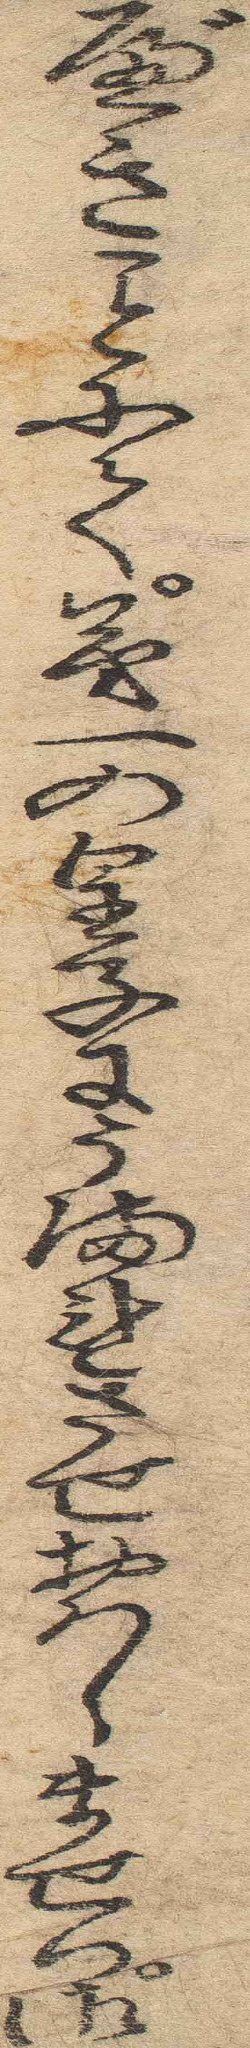べきことにて。第一の皇子にうまれさせおはしませり。御
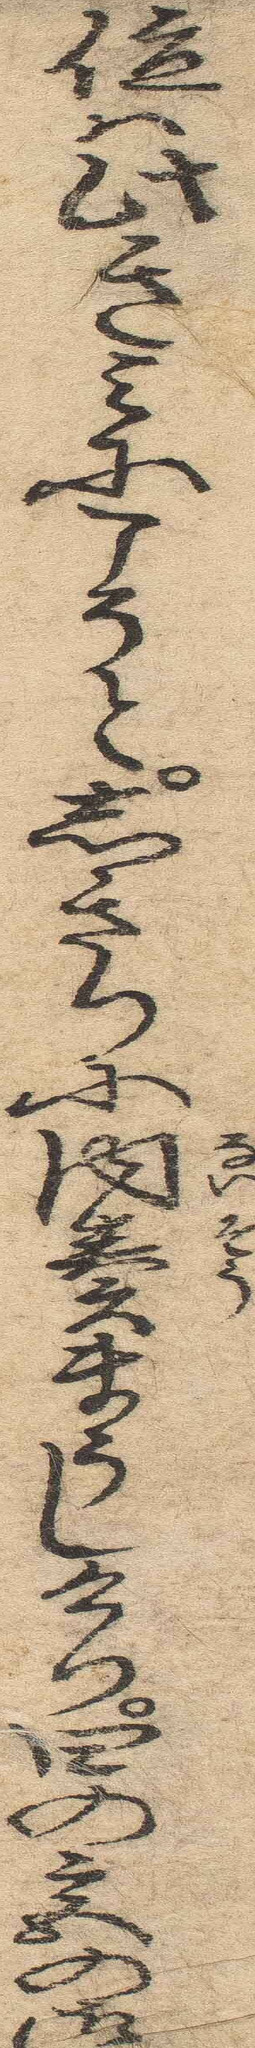位は此きみにこそと。しきりに内奏まうしけり。四の宮の御
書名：古今相撲大全
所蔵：東京学芸大学附属図書館 国文学研究資料館
